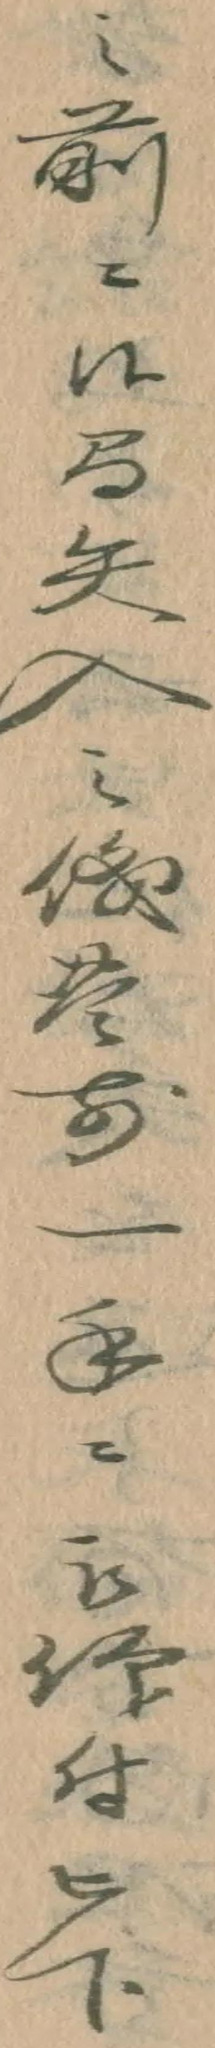之前に候間矢入之儀豊前一手に被仰付被下
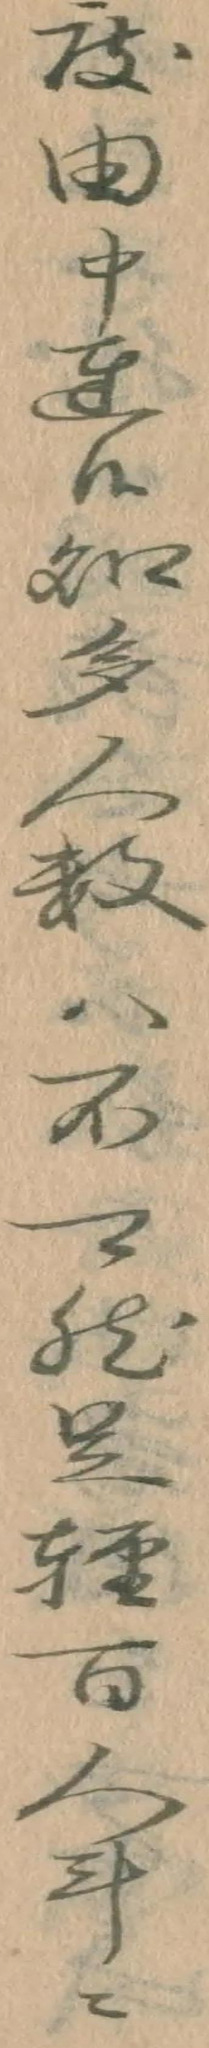度由申達候処多人数は不可然足軽百人斗に
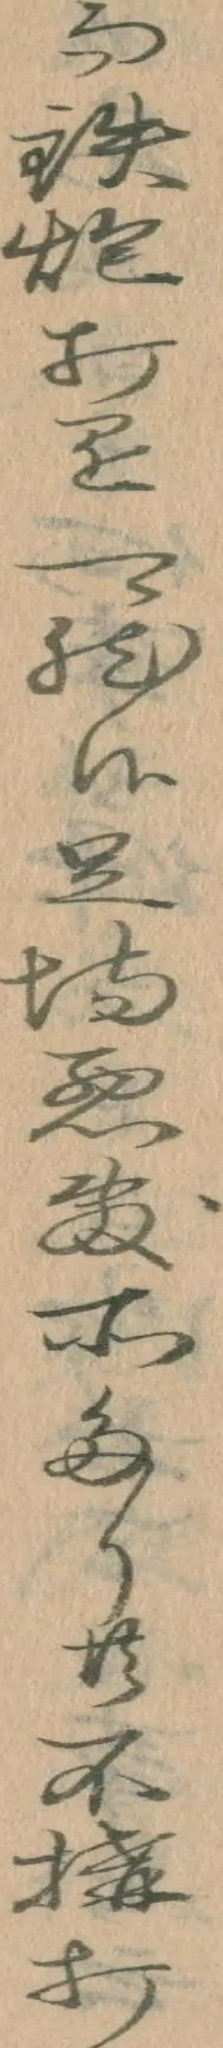而鉄炮打懸可然候足場悪敷所多り共不構打
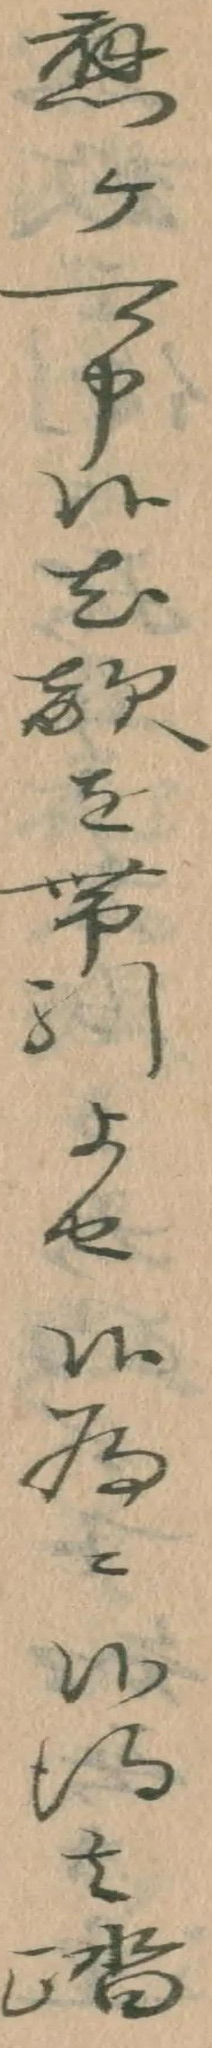懸け可申候尤敵を帯引よせ候為に候得者踏
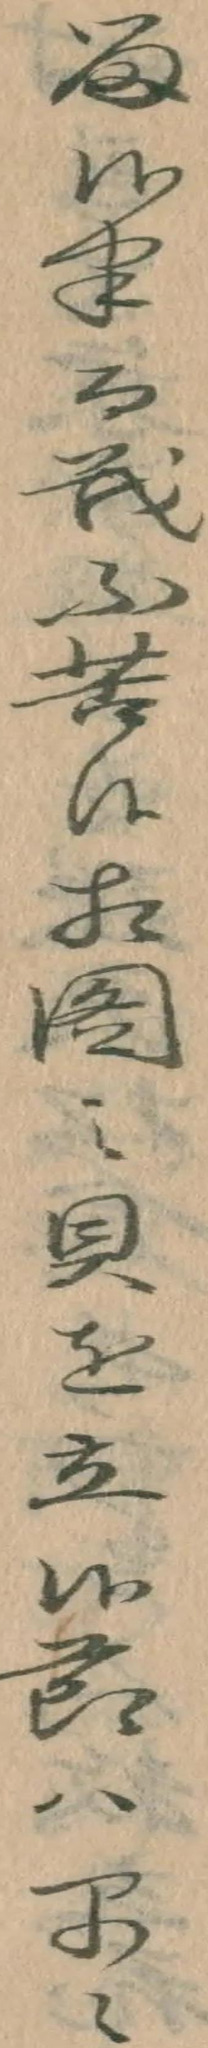留候半而茂ふ苦候相図之貝を立候節は早々
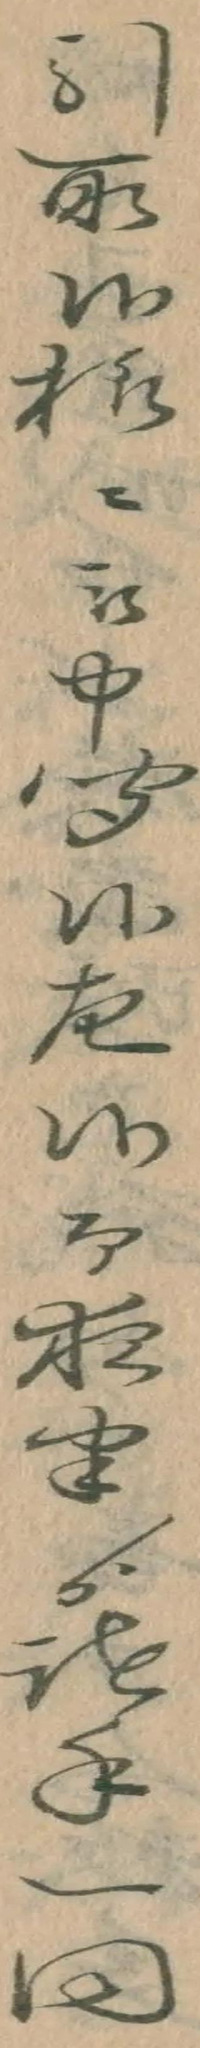引取候様に被申聞候左候而夜半ゟ諸手一同
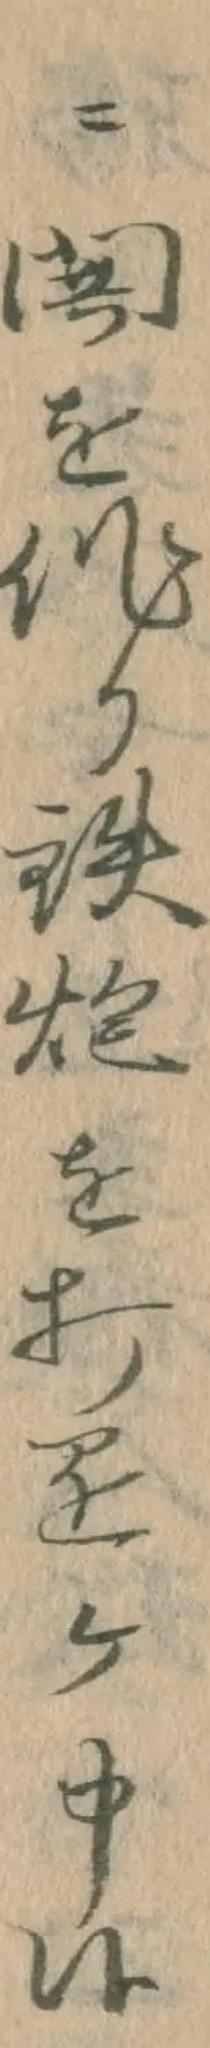に鬨を作り鉄炮を打懸け申候
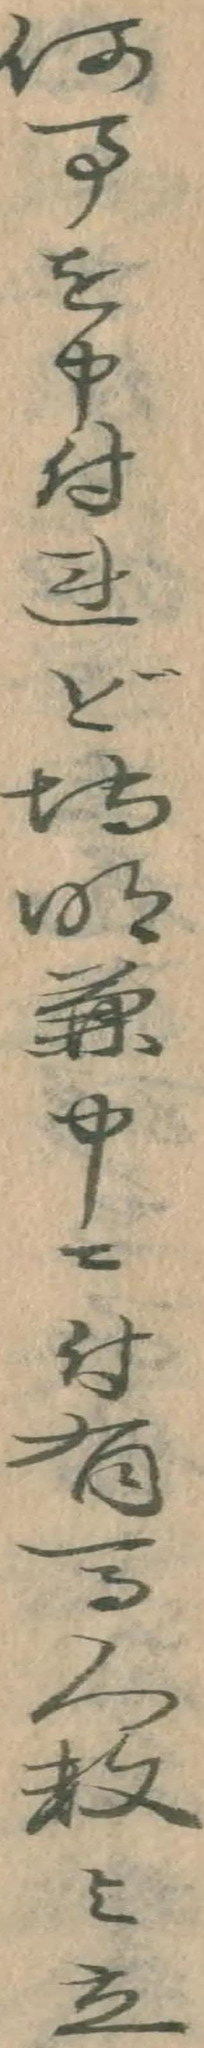何事を申付連ど埒明兼申に付有馬人数与立
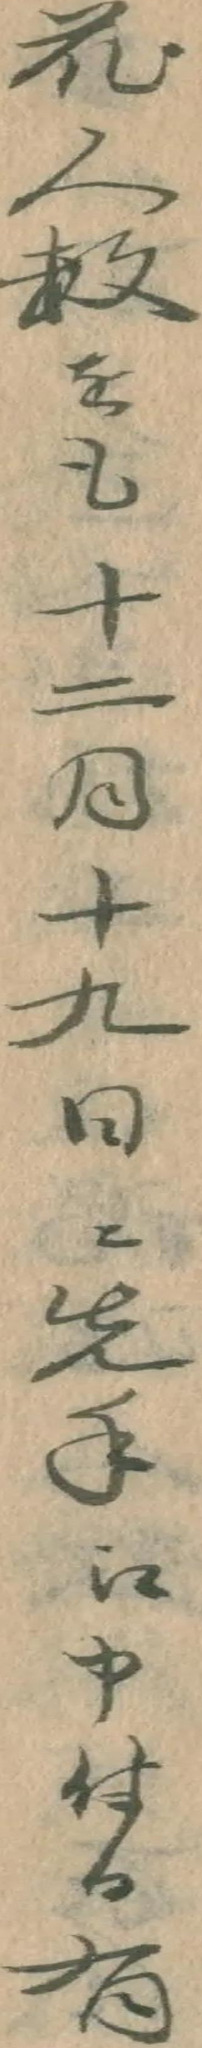花人数をも十二月十九日に先手江申付る有
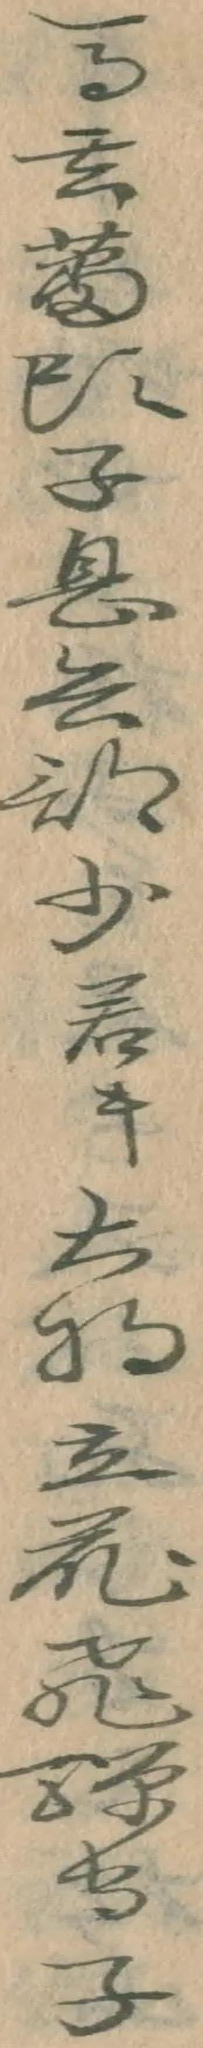馬玄蕃頭子息兵部少若き大将立花飛騨守子
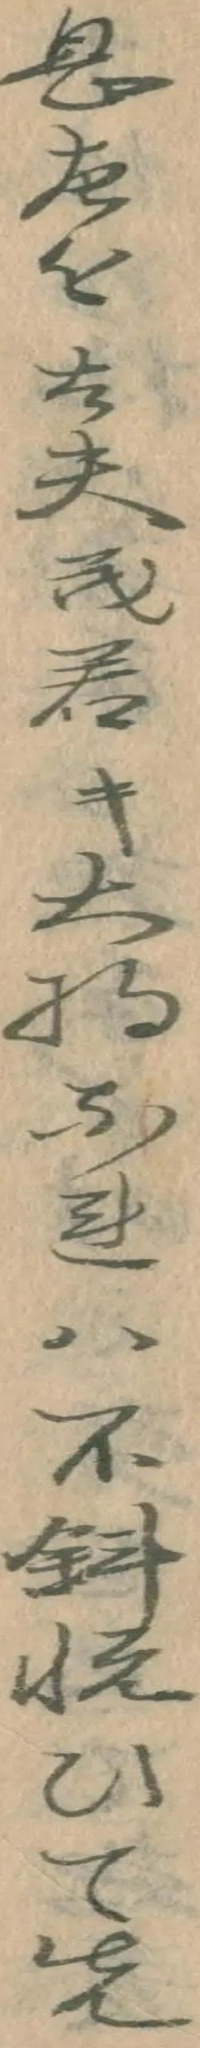息左近太夫茂若き大将な連は不斜越ひて先
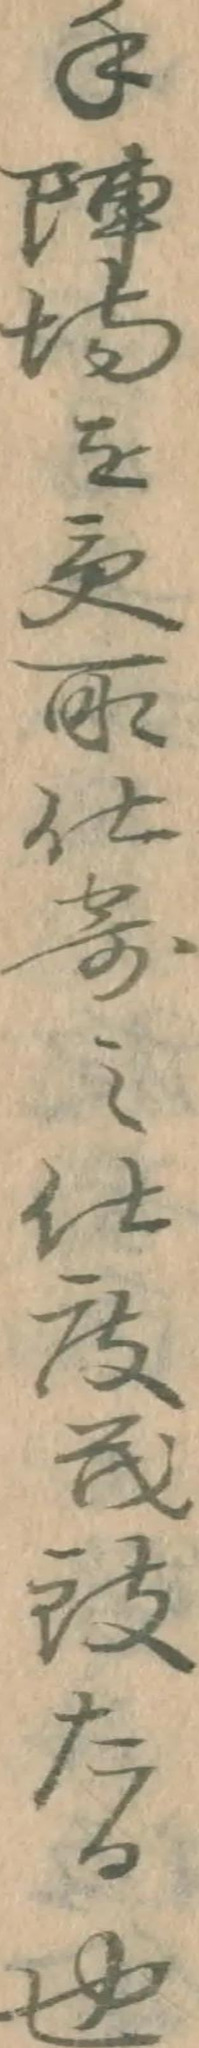手陣場を受取仕寄之仕度茂致たる也

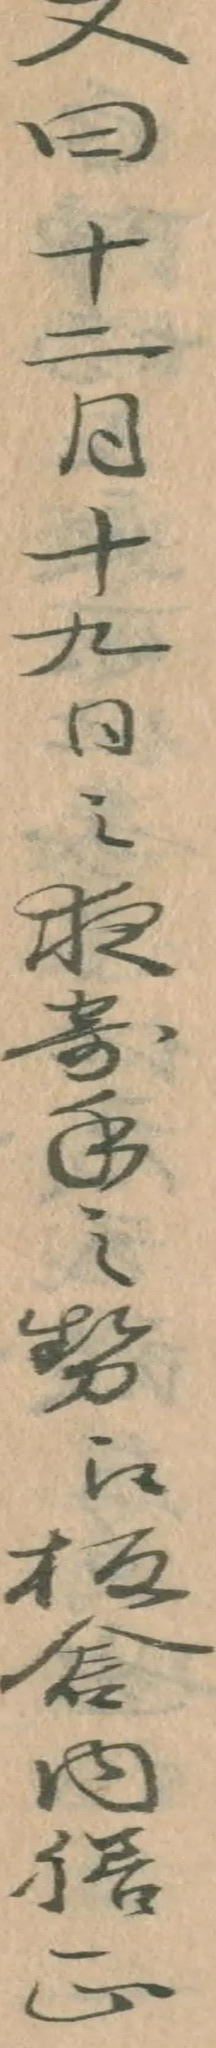又曰十二月十九日之夜寄手之勢江板倉内膳正
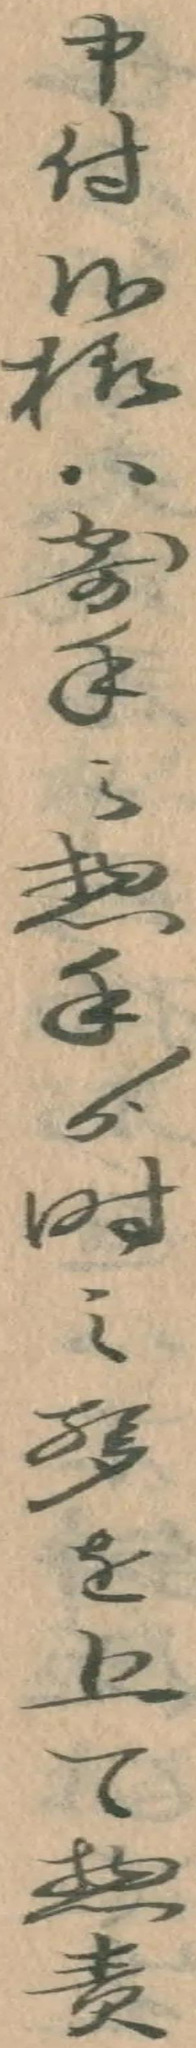申付候様は寄手之惣手ゟ時之声を上て惣責
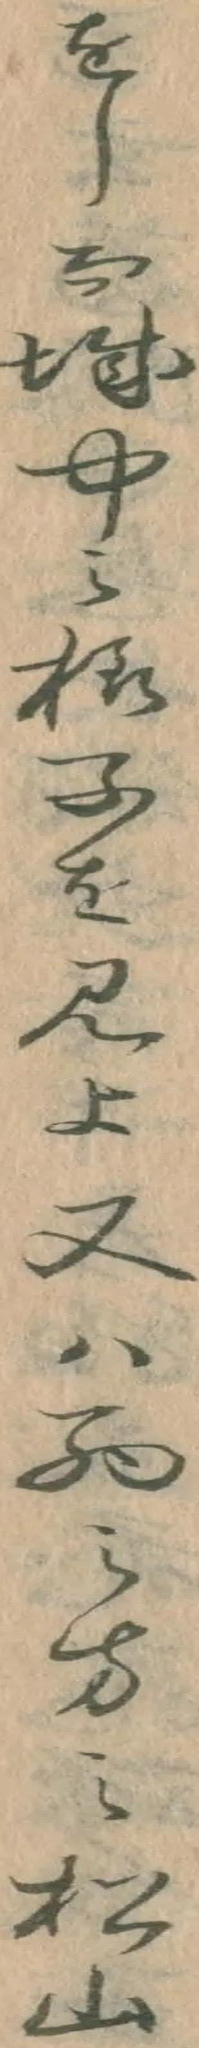をし而城中之様子を見よ又は西之方之松山
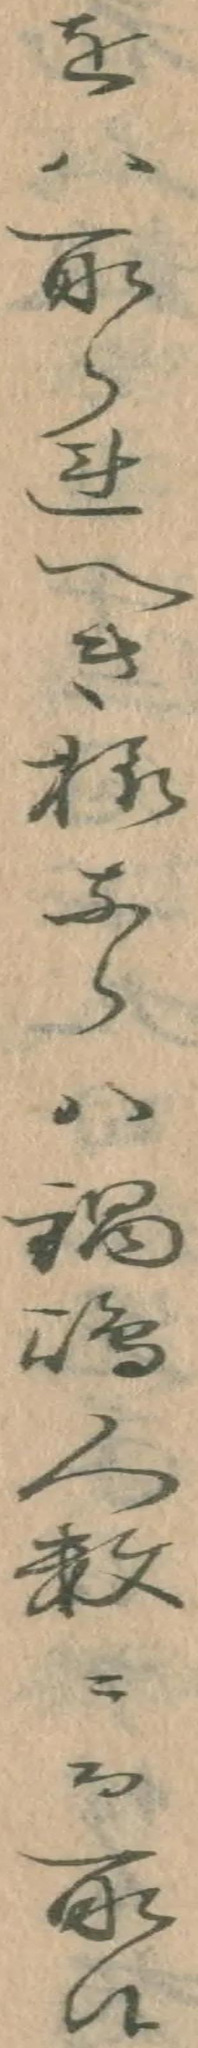をは取ら連へき様ならは鍋島人数に而取候
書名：切支丹御退治記 49巻. [4]
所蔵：国立国会図書館 National Diet Library, JAPAN
